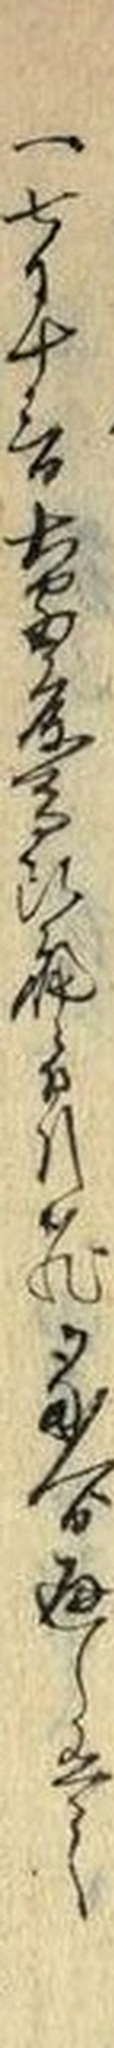一七月十三日大宮藤馬頭痛ニ付引籠御用人ゟ通し有之
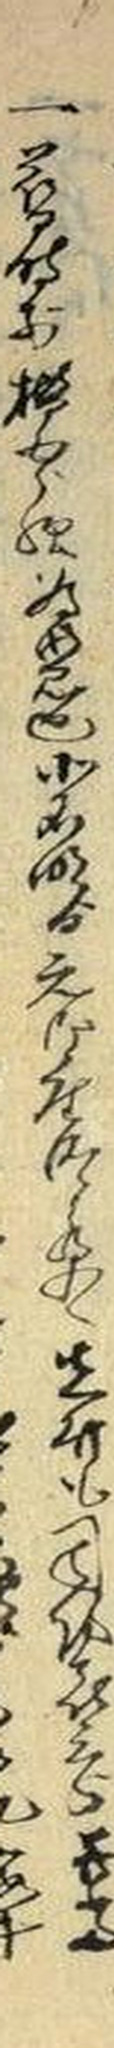一暮時前揩五郎様為御見廻北不明ゟ元御座所へ不為入候先刻も周防喜三郎并当
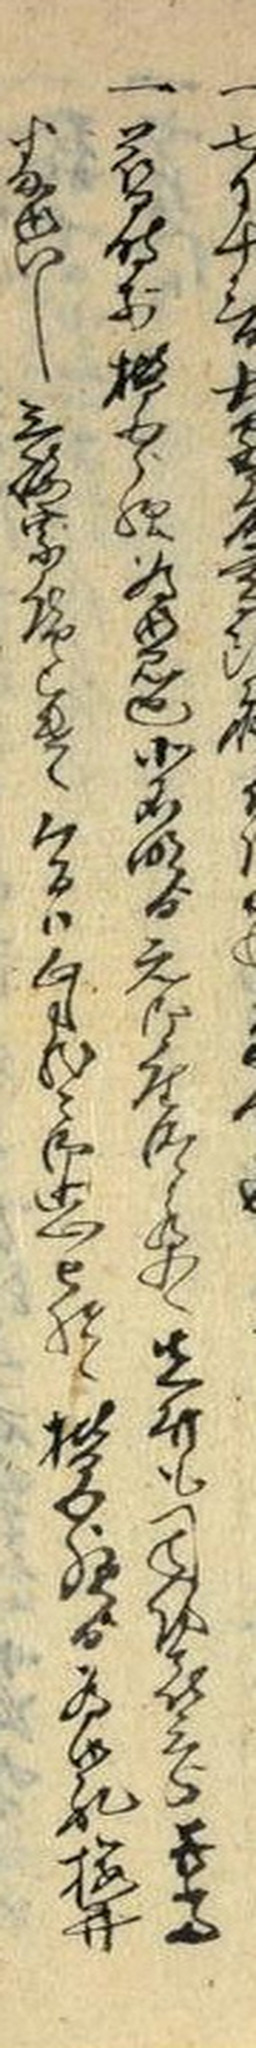番御いし三崎宗庵被遣候今日ハ句作ニ御盡被遊候揩五郎様ゟ為御礼桜井
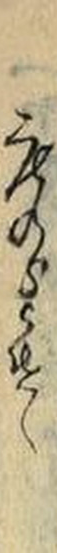庄九郎被遣候
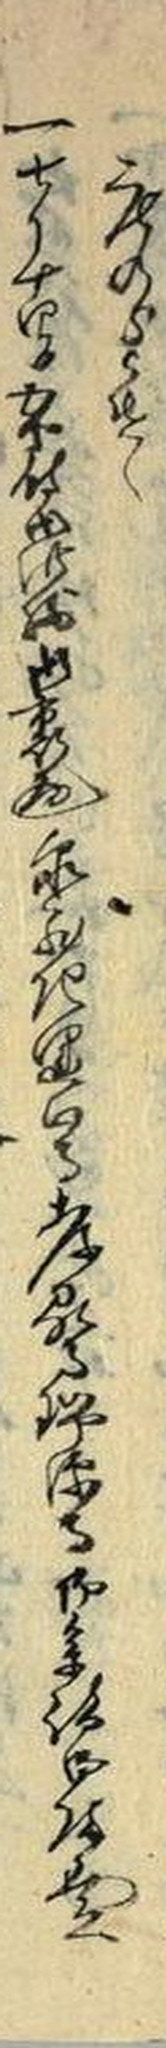一七月十四日五半時御供揃御裏通泉蔵院運正寺孝顕寺瑞源寺御参詣御帰殿
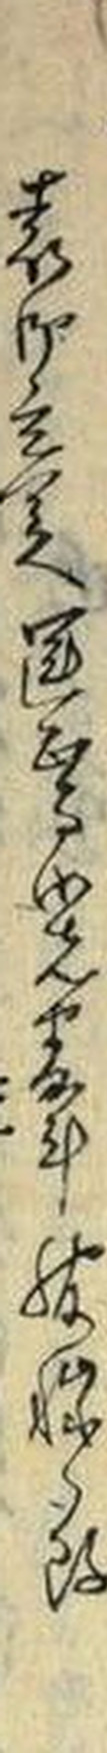表御玄関運正寺御先番斗服穢御改
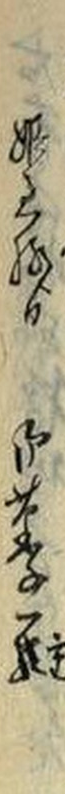姫君様ゟ御菓子一重
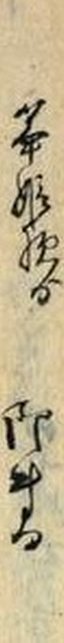箏姫様ゟ御書
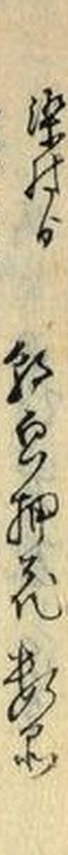染村ゟ朝顔押花数品
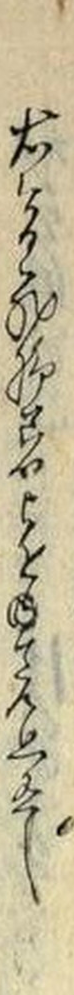右今日飛脚着被進内々差上有之
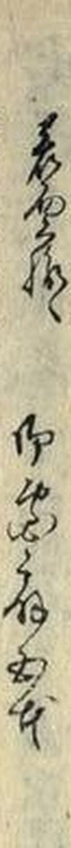若殿様へ御団扇五本
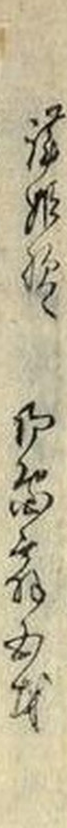謹姫様へ御団扇五本
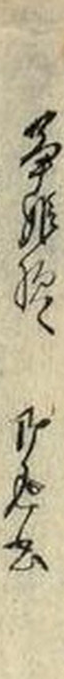箏姫様へ御返書
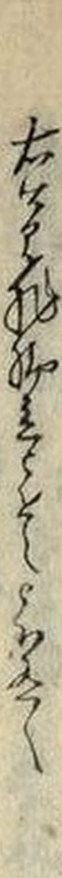右今日飛脚立被進之被下有之
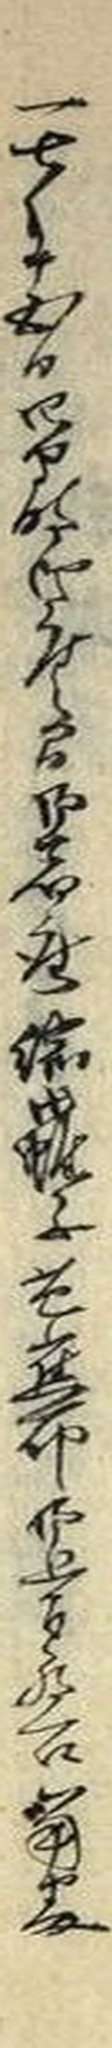一七月十五日四半時御座之間御着座縮御帷子芭蕉布御上下被為召御用番
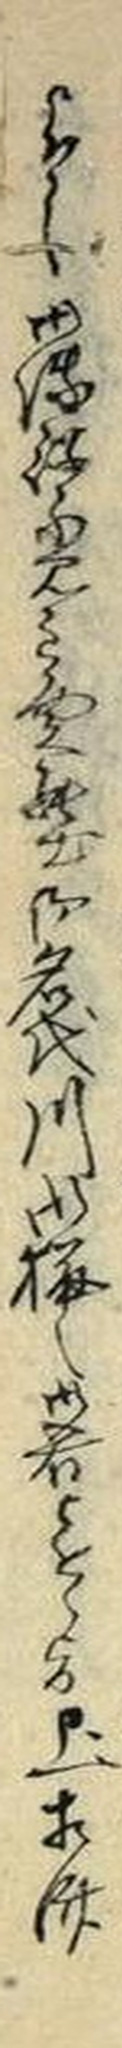被下之御傅役永見主殿罷出御名代川御猟之御肴被進候旨申上相済
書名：少傅日録抄（斉承付側向頭取日記、在国）
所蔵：福井県文書館 Fukui Prefectural Archives
